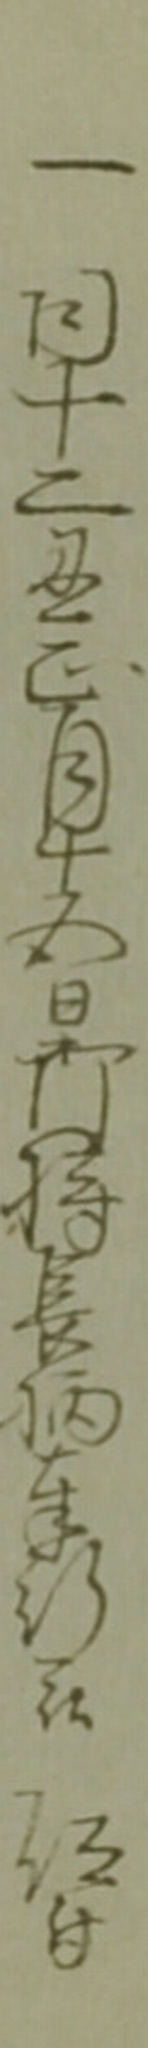一同十二丑正月十五日御持長柄奉行被仰付
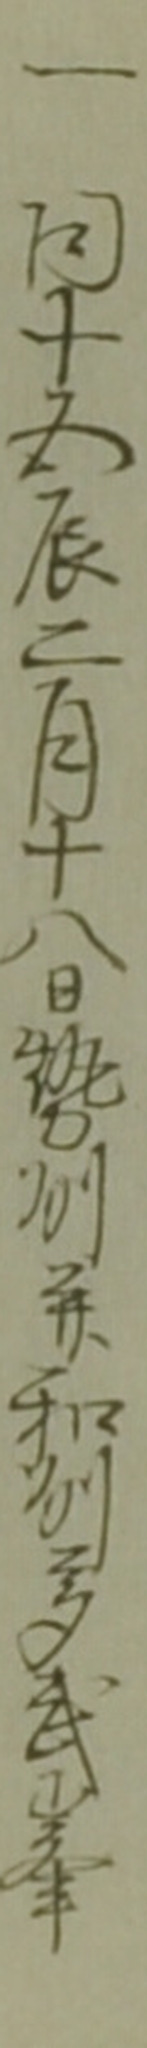一同十五辰二月十八日勢州幷和州多武峯
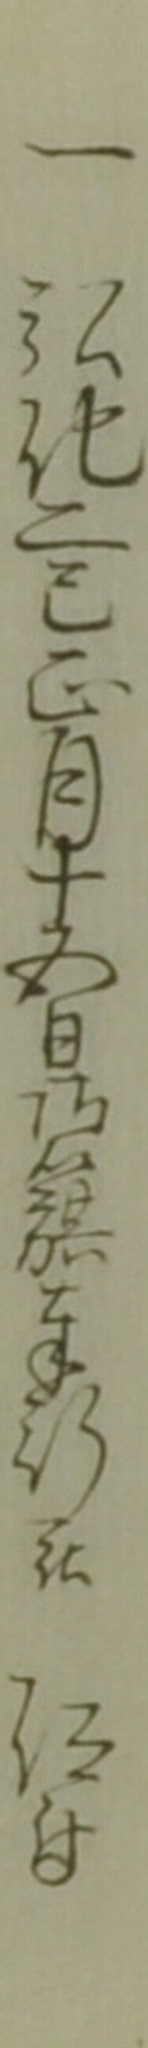一弘化二巳正月十五日御籏奉行被仰付
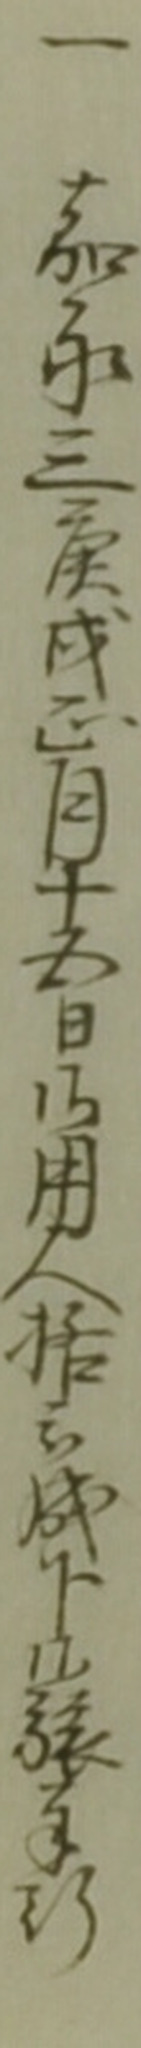一嘉永三庚戌正月十五日御用人格被成下御旅奉行
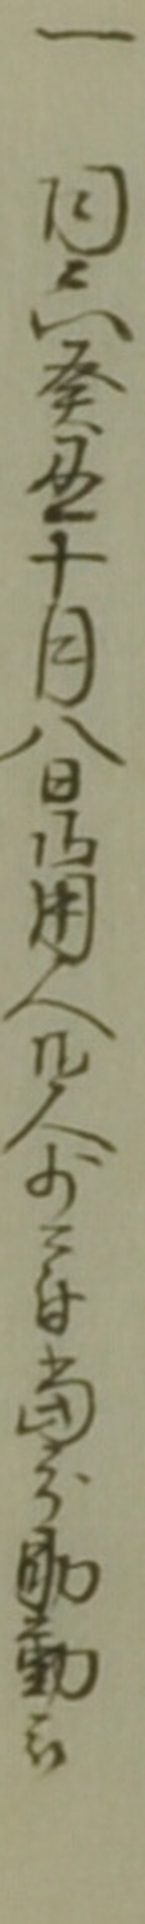一同六癸丑十月八日御用人共人少ニ付当分助勤被
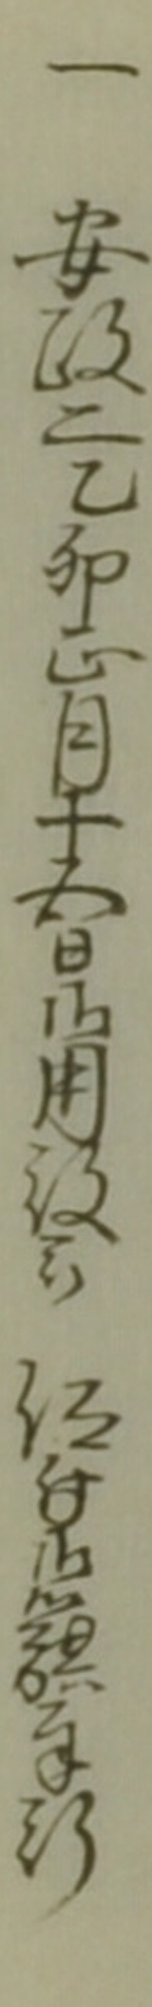一安政二乙卯正月十五日御用役被仰付御籏奉行
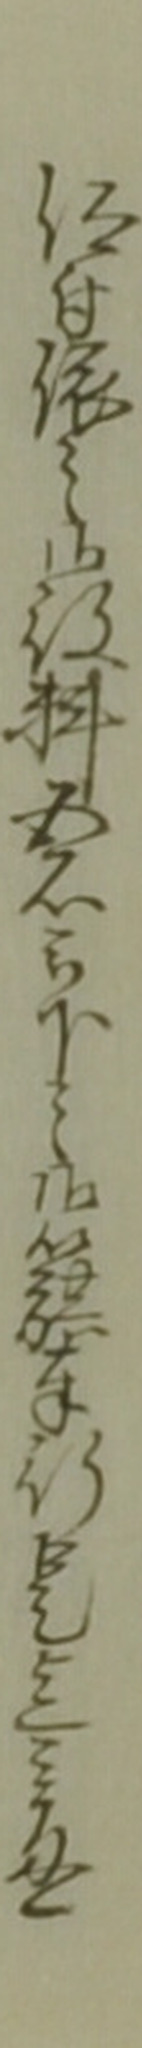仰付依之御役料五石被下之御籏奉行是迄之通

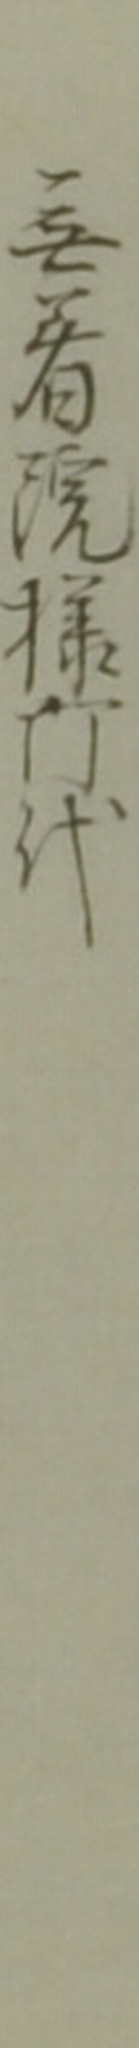無着院様御代
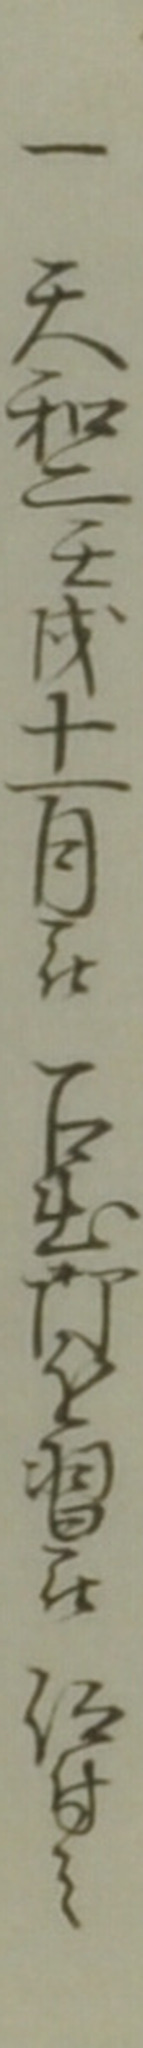一天和ニ壬戌十一月被召出御近習被仰付之
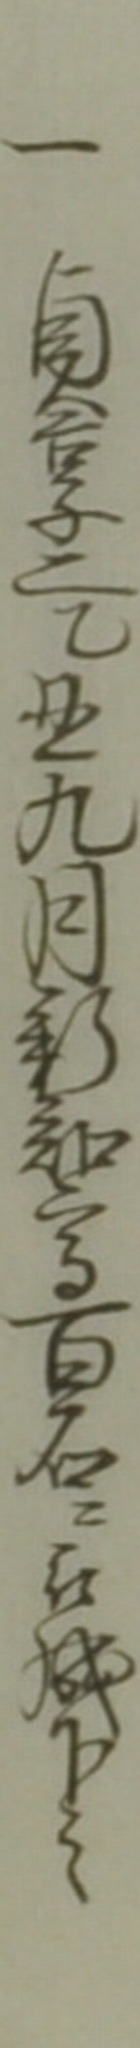一貞享二乙丑九月新知高百石ニ被成下之
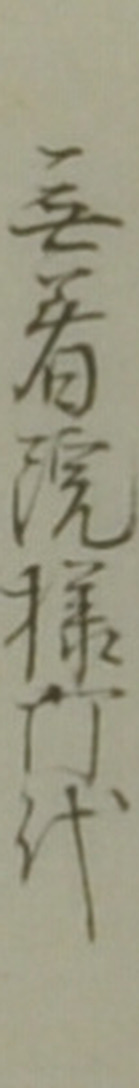無着院様御代
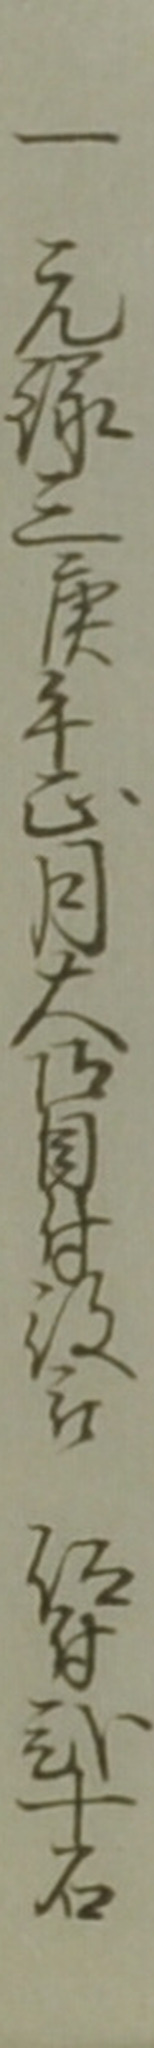一元録三庚午正月大御目付役被仰付弐十石
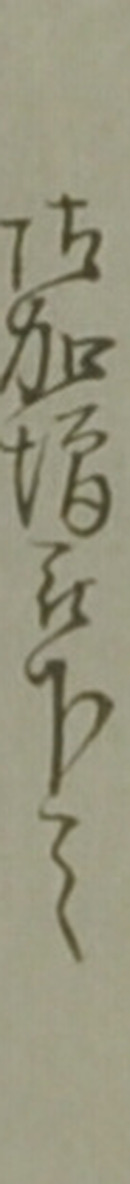御加増被下之
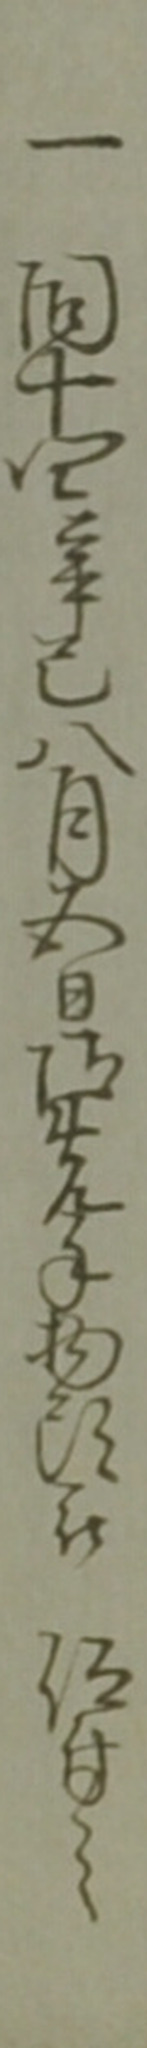一同十四辛巳八月五日御先手物頭被仰付之
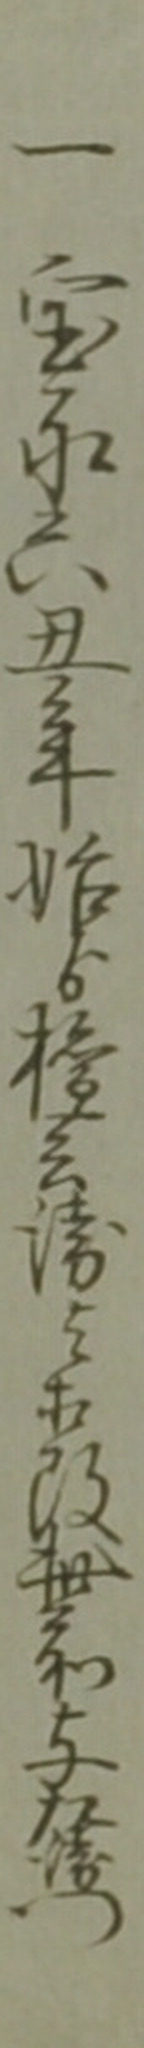一宝永六丑年始ゟ権兵衛と相改此前与左衛門
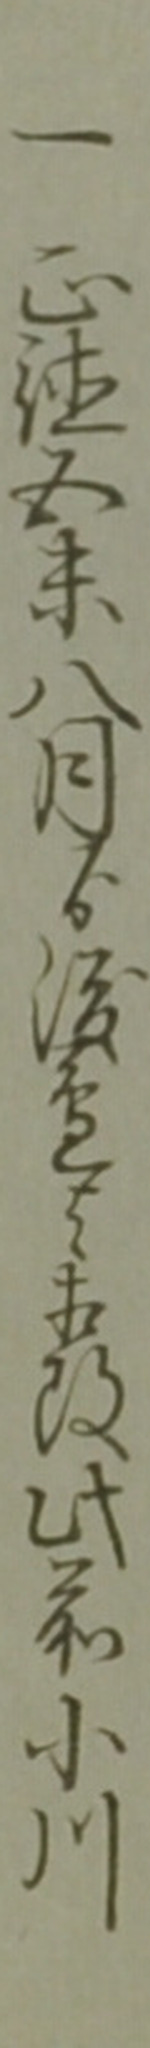一正徳五未八月ゟ渡辺と相改此前小川
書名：給人諸士勤仕録（三）
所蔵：伊那市立高遠町図書館・合同会社AMANE
